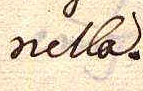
nella.
